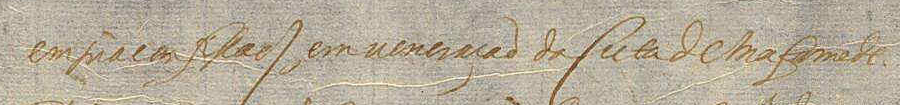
em sua confissaõ, em ueneraçaõ da Ceita de mafamede
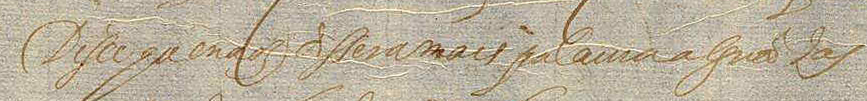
Disse que naõ dissera mais palaura alguā das
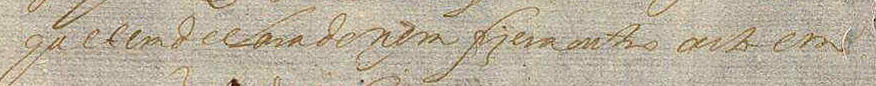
que tem declarado nem fizera outro acto em
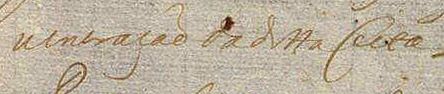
ueneraçaõ da ditta Ceita
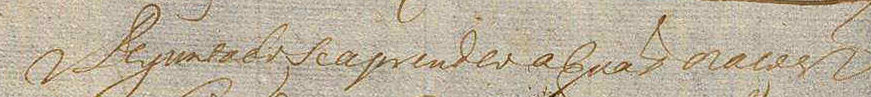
item Perguntado se aprendeo alguās oraçoẽs
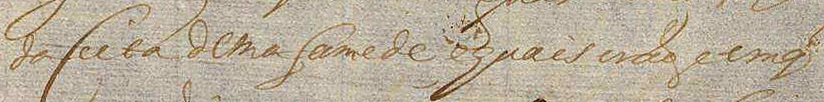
da Ceita de mafamede e quaes eraõ e em q̄
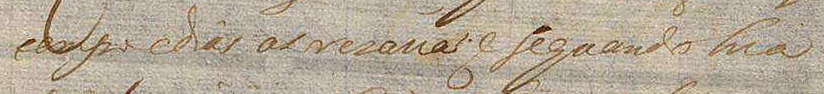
tempo e dias as rezaua e se quando hia
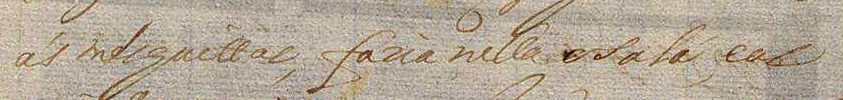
ás mesquittas, fazia nella o salá, e as
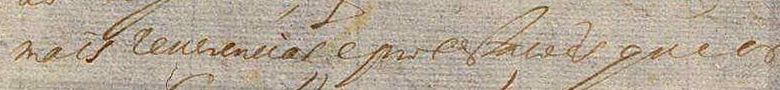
mais reuerencias, e protestaçoẽs que os
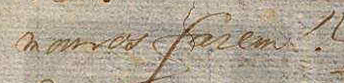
mouros fazem?
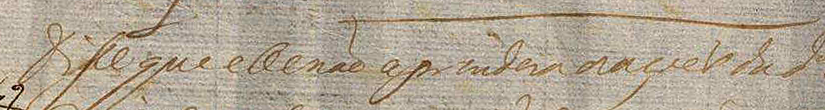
Disse que elle naõ aprendera oraçoẽs da d.a
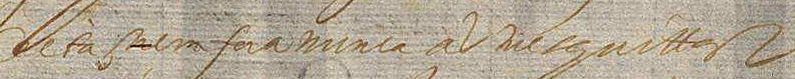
Ceita nem fora nunca as mesquittas
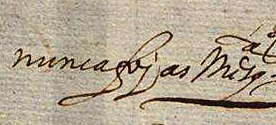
nunca foj as Mesq.tas
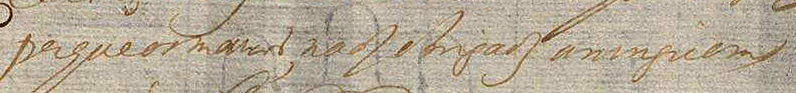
porque os mouros naõ obrigaõ a ninguem
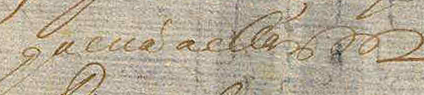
que uā a ellas
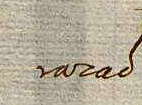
razaõ
